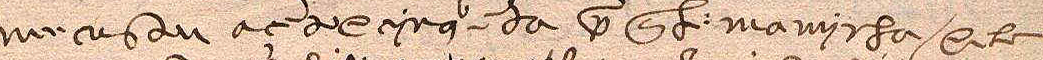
me custou a cēto e cynqoeta p̄oq̄ he manynha / e ele
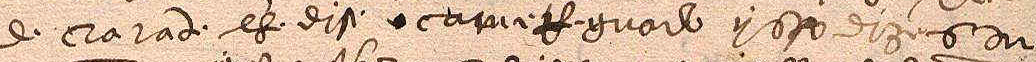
decrarāte lhe dise o carne Reguado ysso djzes tu
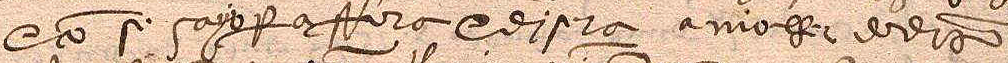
e c̄o se sayo ꝑa ffora e djsera a molher do dito
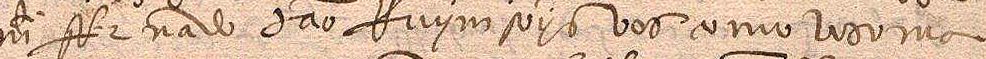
mte ffernādo tão Ruym soys vos como voso ma
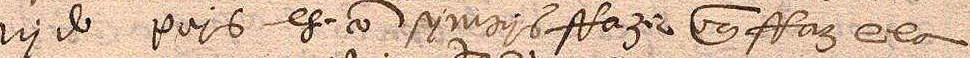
rydo poys lhe c̄osymtys ffazer o q̄ ffaz e ela
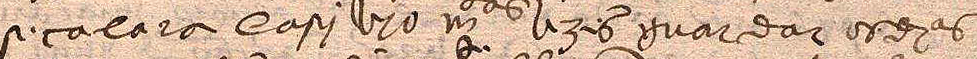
se calara e asy vyo mtas vezes guardar os djas
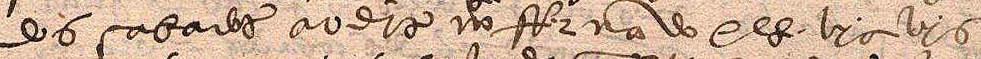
dos sabados ao dito mte ffernādo e lhe vya vjs
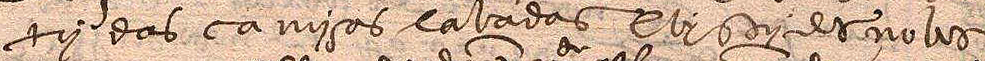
tydas camjsas lavadas e vystydos novos
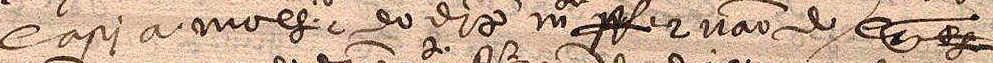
e asy a molher do dito mte ffernãodo / e q̄ lhe
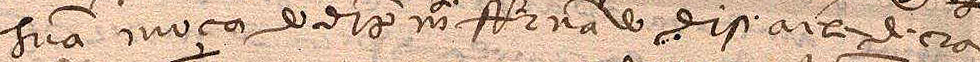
huā moça do dito mte ffernādo dise a ele decra
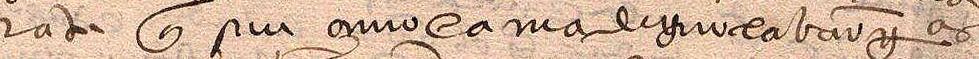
rate q̄ seu amo e ama deguolavão gas
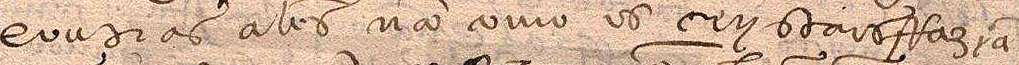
e outras aves não como os crystaos fazyā
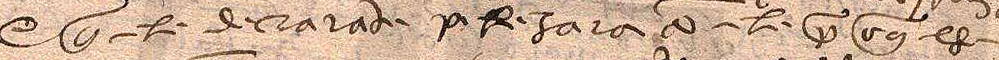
e que ele decrarate peleJara cō ele p̄o o q̄ lhe
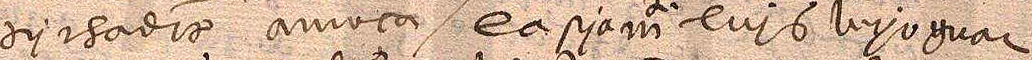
tynha dito a moça / a asy a mte lujs veyo guar
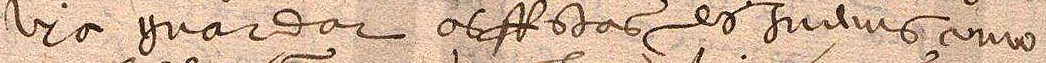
vya guardar as ffestas dos Judeus como
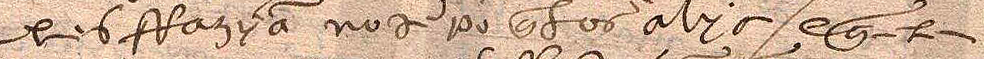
eles ffazyā no tēpo q̄ hos avya / e q̄ ele
